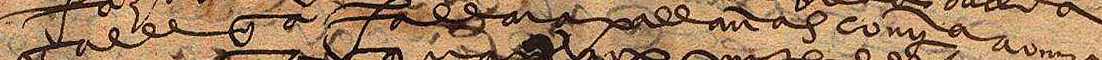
gallega fallara pallauras comtra a omra
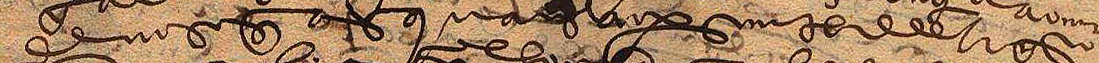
de noso s̄r as quaes ao ꝑsemte elle vigro
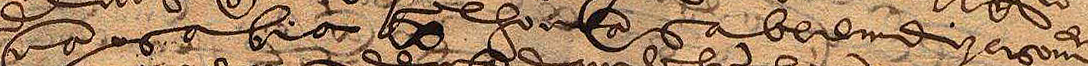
nā sabia p̄o lho nā saberem dizer somte
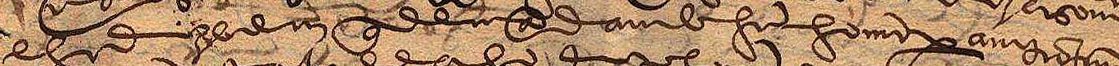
lhe dizerem q̄ demādando hū homē ꝑamte o Juiz
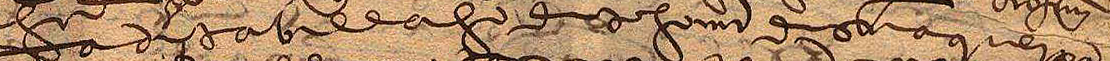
da dita villa ho dito homē disera quejxā
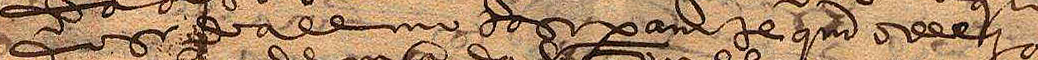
dose do allmotase ꝑamte quē o elle Ja
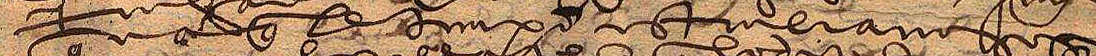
q̄ naq̄le tempo estiuera noso s̄r
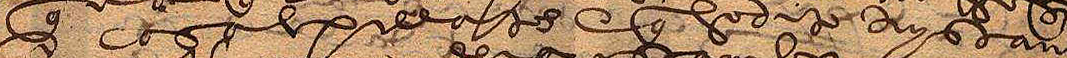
ē casa pillatos e q̄ ho dito trystam
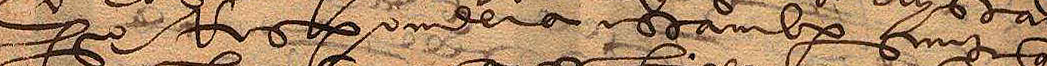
frco Respondera estando ꝑsemte q̄
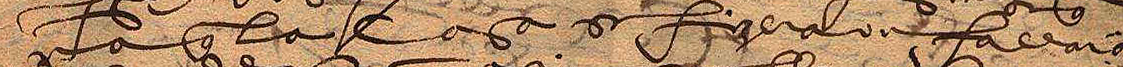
naq̄la casa se fizera ou fallara
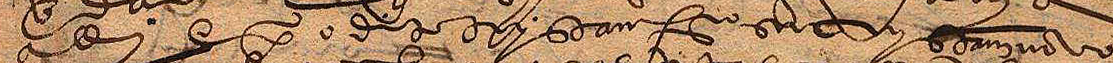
allj e p̄o o dito trystam frco ser crystam novo
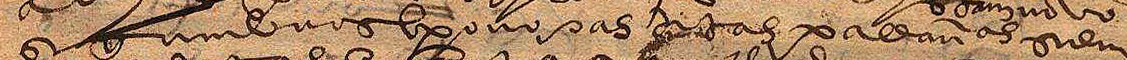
segundo uos do pouo e as ditas pallauras serem
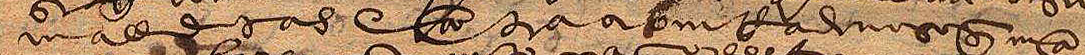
mallditas e cōtra a omRa de noso s̄r mā
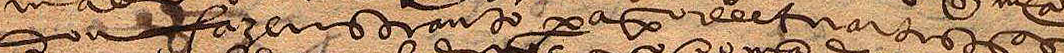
dou fazer este auto ꝑa p̄o elle tirar testas
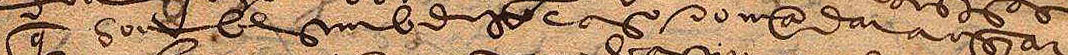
q̄ soubesem do dito caso e o mādar ao s̄r ar
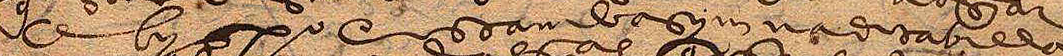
cebyspo e estando asym na dita villa
